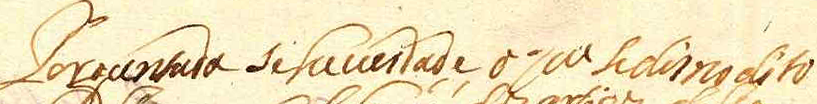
Perguntada se he uerdade, o que se dis no dito
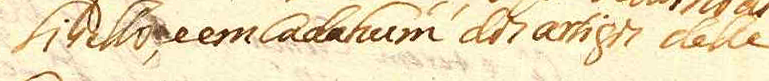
libello, e em cada hum dos artigos delle
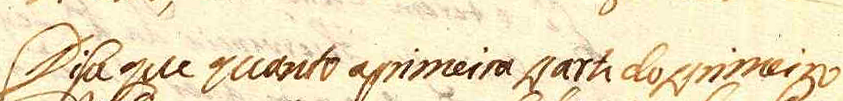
Disse que quanto a primeira parte do primeiro
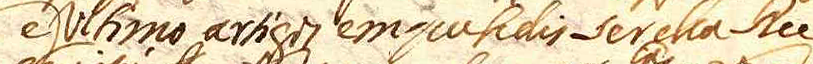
e Vltimo artigos em que se dis ser ella Ree
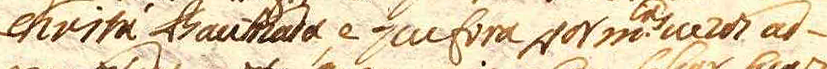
christã Bautizada, e que fora por m.tas uezes ad
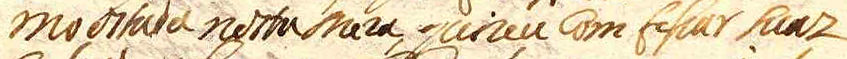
moestada nesta Meza, quizece comfessar suaz
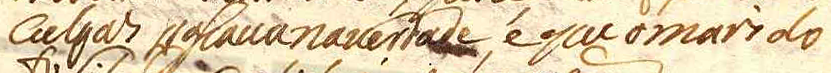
culpas passaua na uerdade, e que o mais do
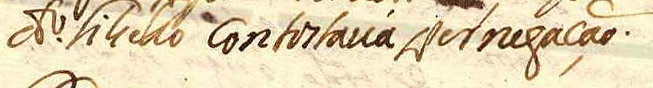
d̄o. libello contestaua por negaçaõ.
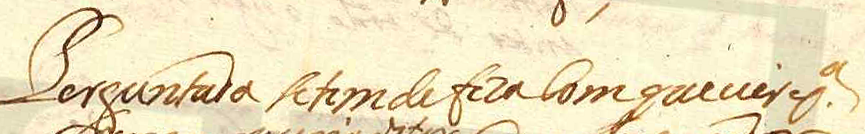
Perguntada se tem defeza com que uir p.a
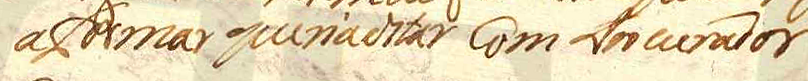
a formar, queria estar com Procurador
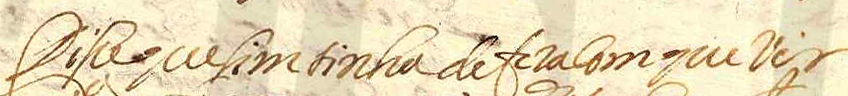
Disse que sim tinha defeza com que vir
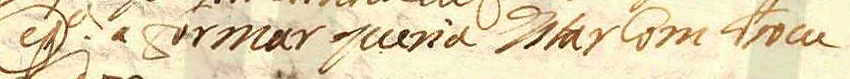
e p.a a formar queria Estar com Procu
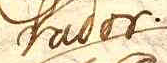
rador.
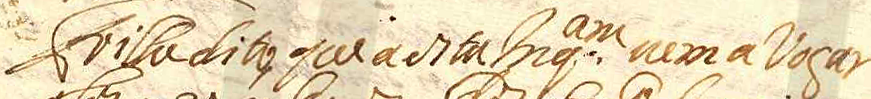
Foilhe dito, que a esta Inq.am uem aVogar
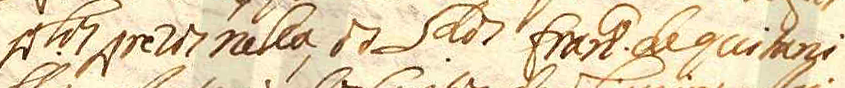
p.los prezos nella, os Ld.os fran.co de quitani
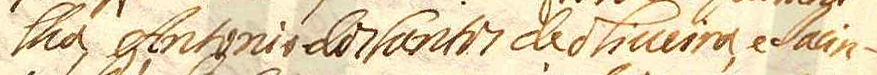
lha, Antonio dos santos de oliueira, e Iacin
